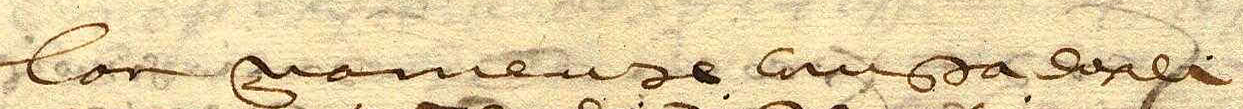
larguamente comsta dos di
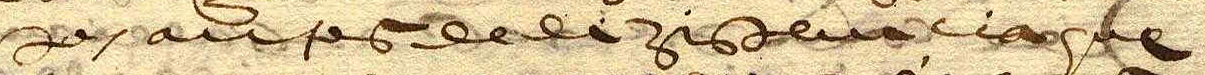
tos autos de dizistemcia que
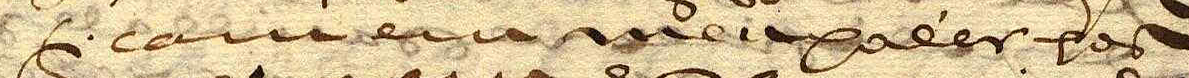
ficam em meu poder hos
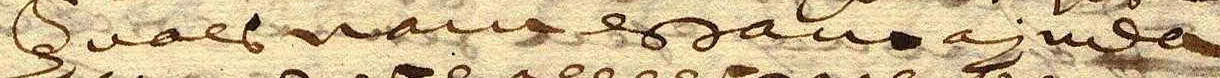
quaes nam estam ajmda
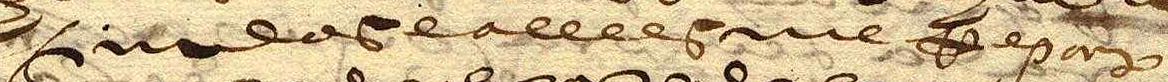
fimdos e a elles me Reporto
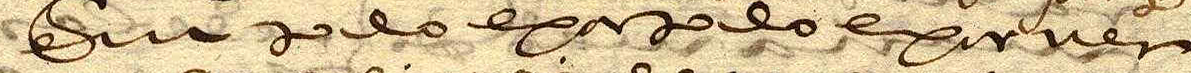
em todo e por todo e por uer
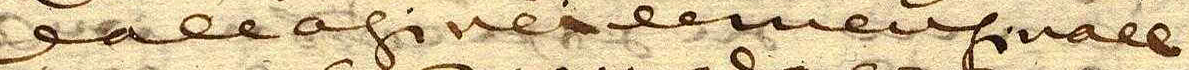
dade asinei de meu sinall
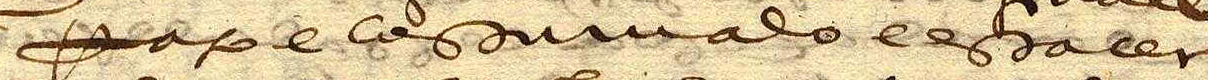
Raso e costumado e esta cer
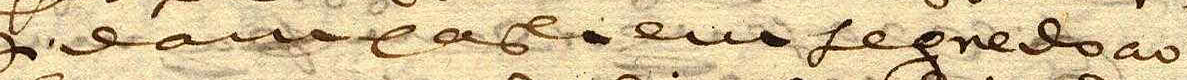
tidam pasei em segredo ao
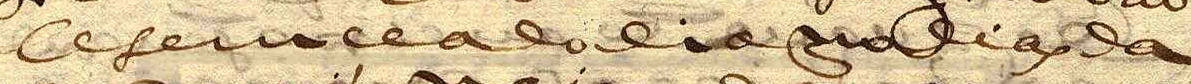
lesemceado dioguo dias da
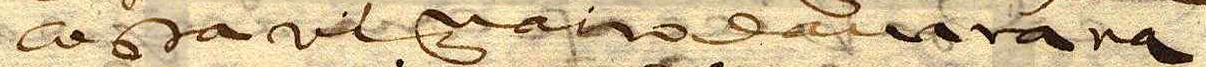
costa viguairo da uara na
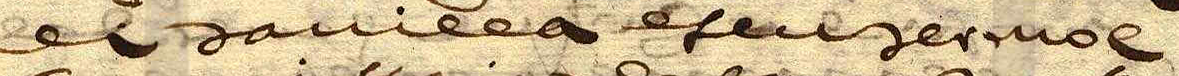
dita uilla e seu termo e
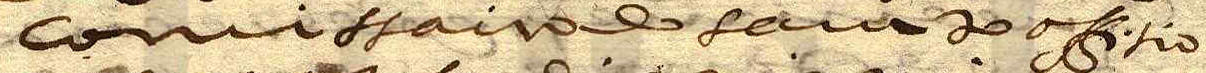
comissairo do samto offisio
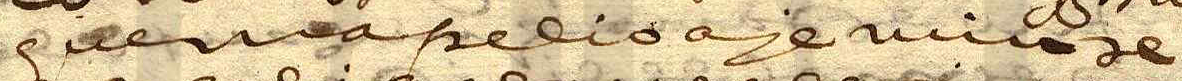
que ma pedio oje uimte
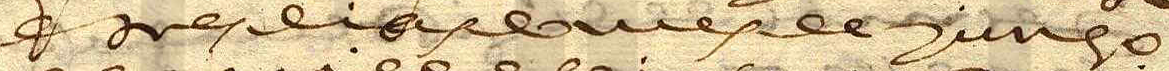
E tres dias do mes de junho
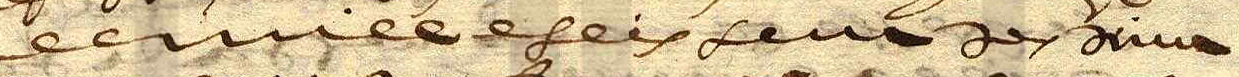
de mill e seissemtos trim
